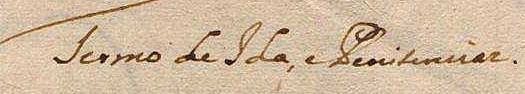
Termo de Ida, e Penitencias.
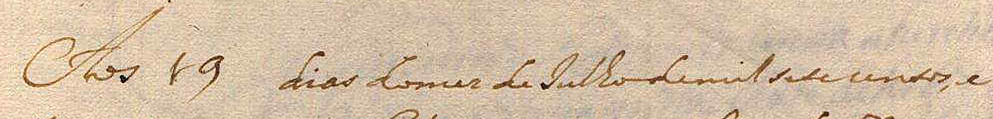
Aos 19 dias do mes de Iulho de mil setecentos, e
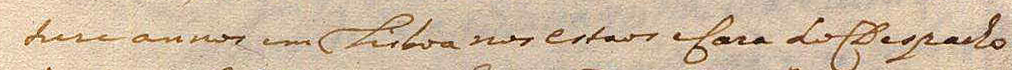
treze annos em Lisboa nos estaos e Caza do Despacho
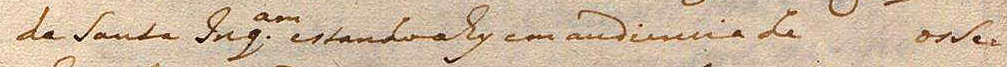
da Santa Inq.am estando ahy em audiencia de os se
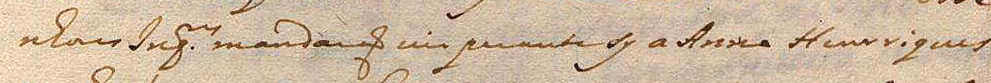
nhores Inq.res mandaraõ uir perante sy a Anna Henrriques
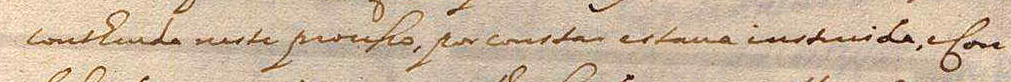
contheuda neste processo, por constar estaua instruida, e Con
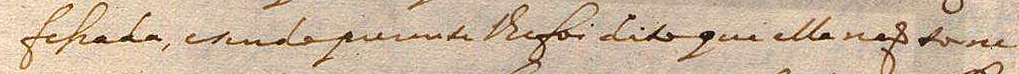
fessada, e sendo prezente lhe foi dito que ella naõ torne
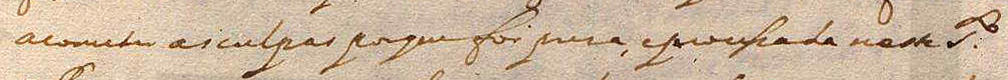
a cometer as culpas porque foi preza, e processada neste s.to
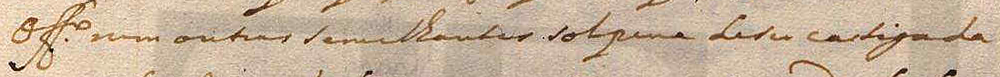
Off.o nem outras semelhantes sob pena de ser castigada
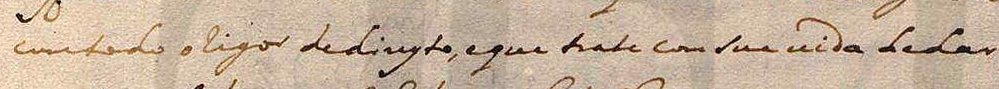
com todo o Rigor de direyto, e que trate com sua uida de dar
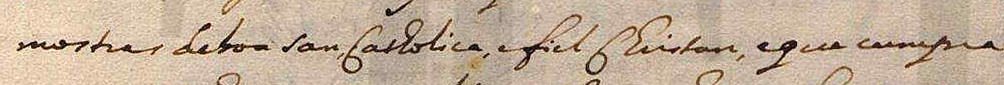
mostras de boa san, Catholica, e fiel Christan, e que cumpra
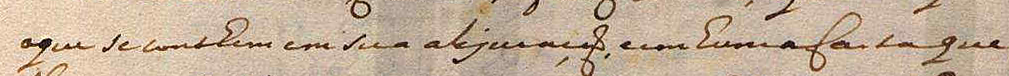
o que se conthem em sua abjuraçaõ, e em huma Carta que
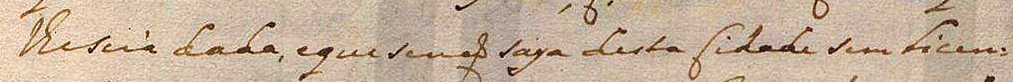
lhe seia dada, e que se naõ saya desta Cidade sem licen
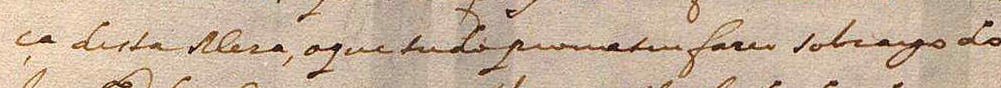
ça desta Meza, o que tudo prometeu fazer sob cargo do
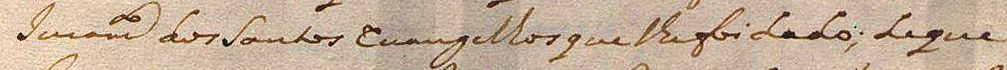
Iuramto dos Santos Euangelhos que lhe foi dado; de que
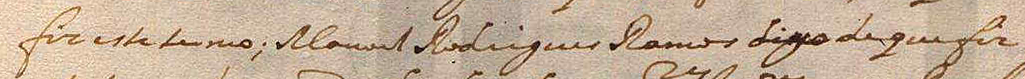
fiz este termo; Manoel Rodrigues Ramos digo de que fiz
